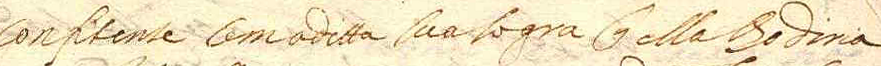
confitente com a ditta sua sogra q̄ ella lho diria
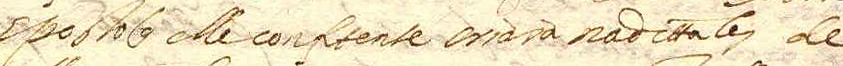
E posto q̄ elle confitente cria ia na ditta lej de
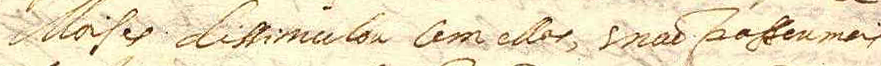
Moises dissimulou com ellas, E naõ passou mais
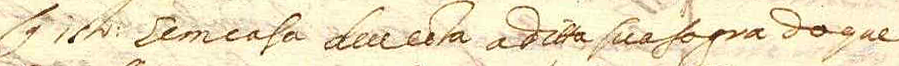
q̄ isto: E em casa deu esta a ditta sua sogra do que
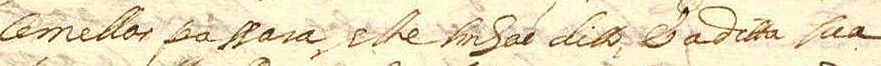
com ellas passara, E lhe tinhaõ ditto, & a ditta sua
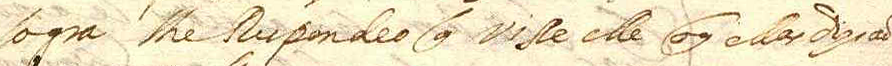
sogra lhe Respondeo q̄ visse elle o q̄ ellas diziaõ
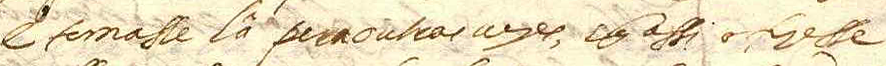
& tomasse lâ pera outras uezes, E q̄ assi o fez elle
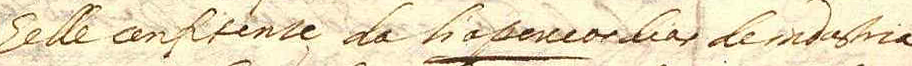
E elle confitente dali a poucos dias de industria
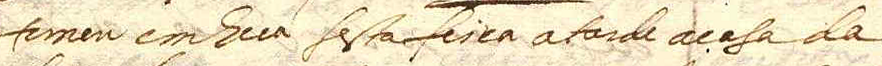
tomou em huā sesta feira a tarde a casa da
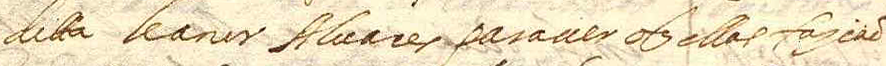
ditta Leanor Aluares para uer o q̄ ellas faziaõ
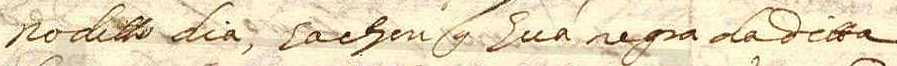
no ditto dia, E achou q̄ huā negra da ditta
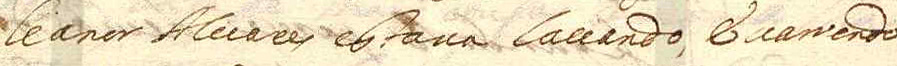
Leanor Aluares estaua lauando, & uarrendo
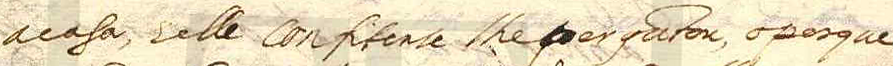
a casa, E elle confitente lhe pergūtou, o porque
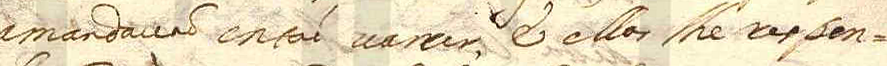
a mandauaõ entaõ uarrer, & ellas lhe respon
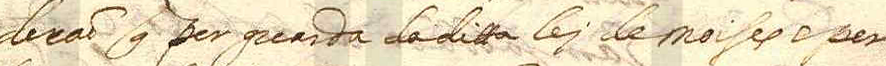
deraõ q̄ per guarda da ditta lej de moises e per
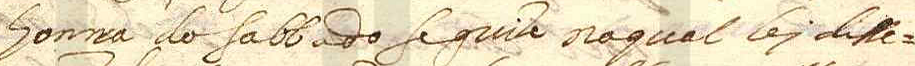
honrra do sabbado seguīte na qual lej disse
